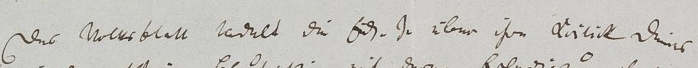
Das Volksblatt tadelt die Eidg. Z. über ihre Kritick Deines
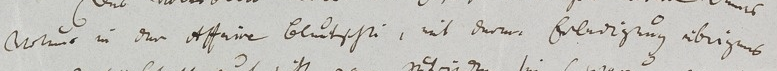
Votums in der Affaire Bluntschli, mit deren Erledigung übrigens
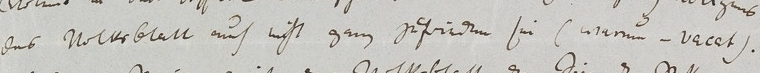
das Volksblatt auch nicht ganz zufrieden sei (warum – vacat).
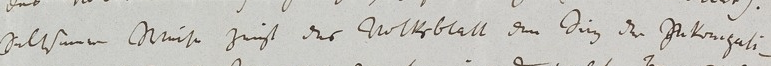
Seltsamer Weise zeigt das Volksblatt den Sieg der Inkompati
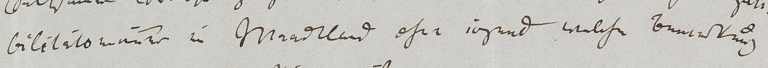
bilitätsmänner im Waadtland ohne irgend welche Bemerkung
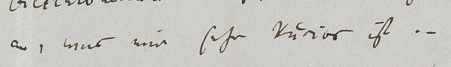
an, was mir sehr kurios ist. –
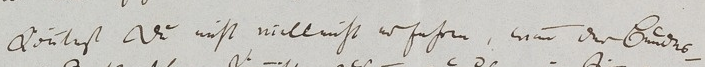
Könntest Du nicht vielleicht erfahren, wann der Bundes-
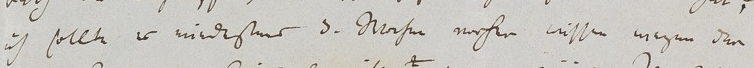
ich sollte es mindestens 3. Wochen vorher wissen wegen der
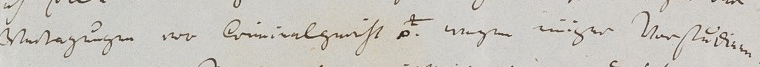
Vertagungen vor Criminalgericht &. wegen einiger Vorstudieen.
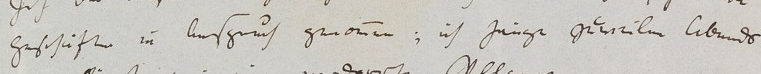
Geschäften in Anspruch genommen; ich hänge zuweilen Abends
